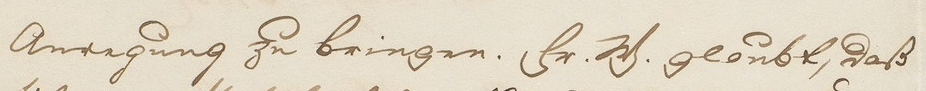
Anregung zu bringen. Hr. W. glaubt, daß
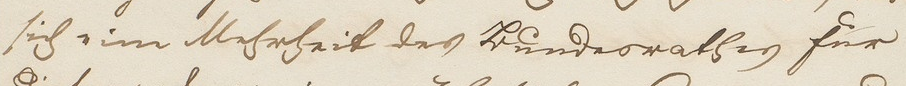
sich eine Mehrheit des Bundesrathes für
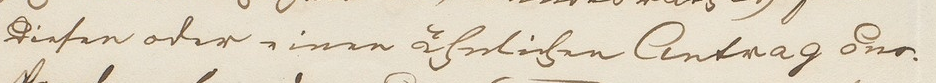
diesen oder einen ähnlichen Antrag aus-
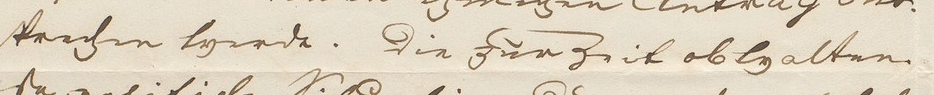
sprechen werde. Die zur Zeit obwalten-
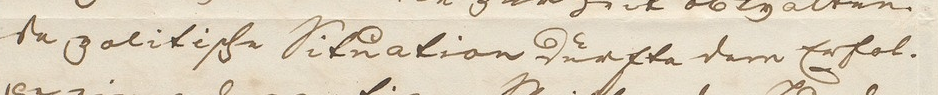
de politische Situation dürfte dem Erfol-
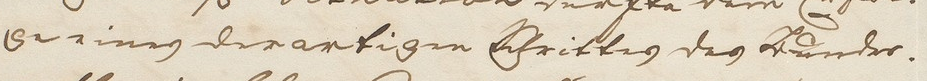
ge eines derartigen Schrittes des Bundes-
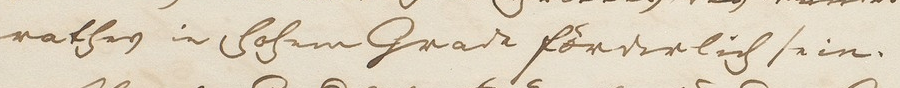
rathes in hohem Grade förderlich sein.
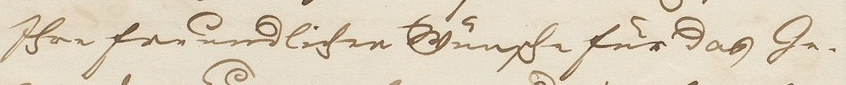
Ihre freundlichen Wünsche für das Ge-
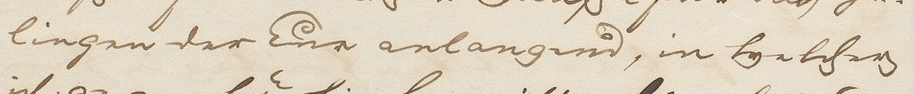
lingen der Cur anlangend, in welcher
